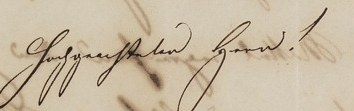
Hochgeachteter
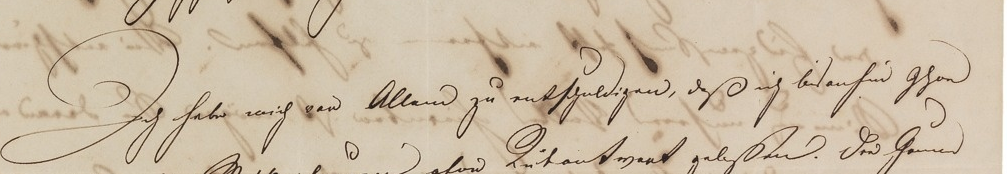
Ich habe mich vor Allem zu entschuldigen, daß ich
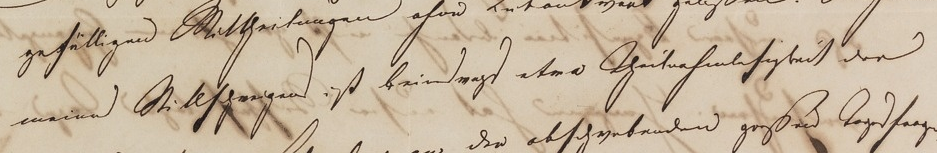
meines Stillschweigens ist keineswegs etwa Theilnahmlosigkeit der
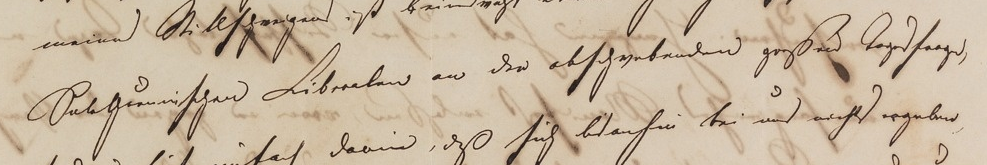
Solothurnerischen Liberalen an der obschwebenden grossen Tagesfrage,
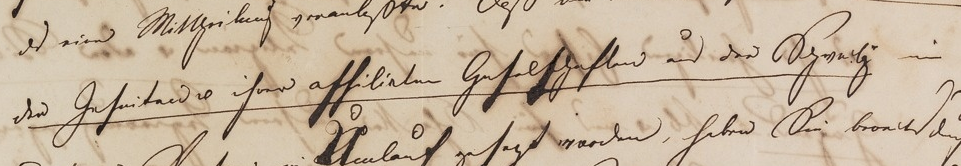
der Jesuiten u ihrer affilirten Geselschaften
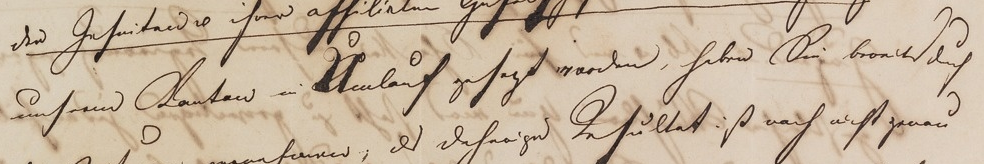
unserm Kanton in Umlauf gesezt worden, haben Sie bereits
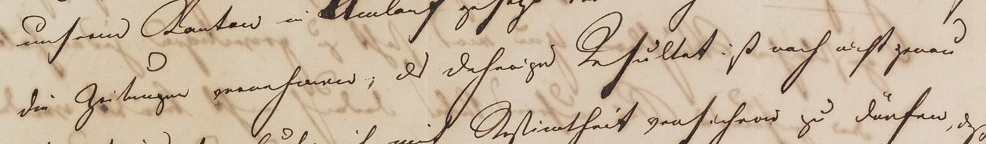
die Zeitungen vernohmen; das daherige Resultat ist noch nicht genau
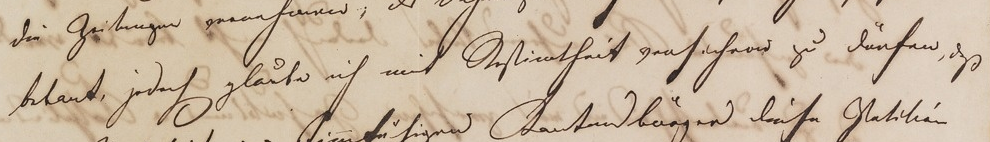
bekant, jedoch glaube ich mit Bestimtheit versichern zu dürfen,
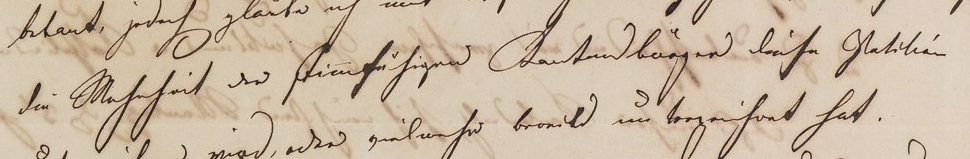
die Mehrheit der stimmfähigen Kantonsbürger diese Petition
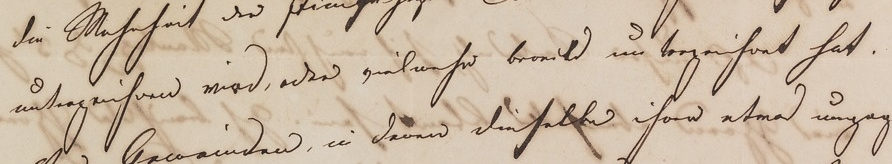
wird, oder vielmehr bereits unterzeichnet hat.
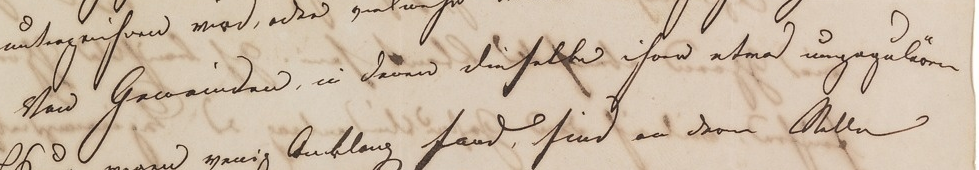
Von Gemeinden, in denen dieselbe ihrer etwas unpopulären
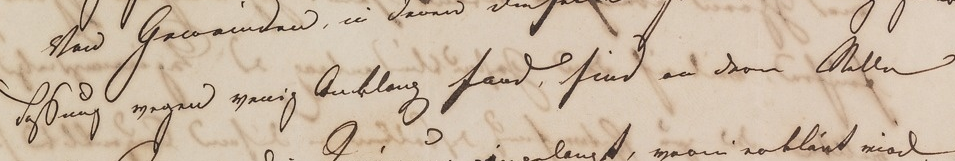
Fassung wegen wenig Anklang fand, sind an deren Stelle
